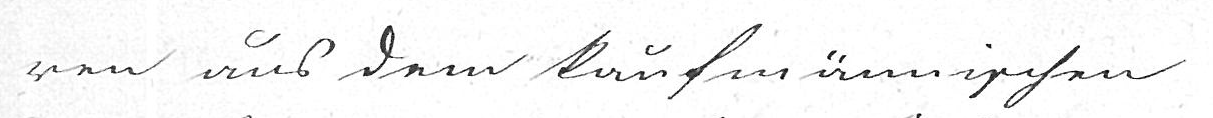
ren aus dem kaufmännischen
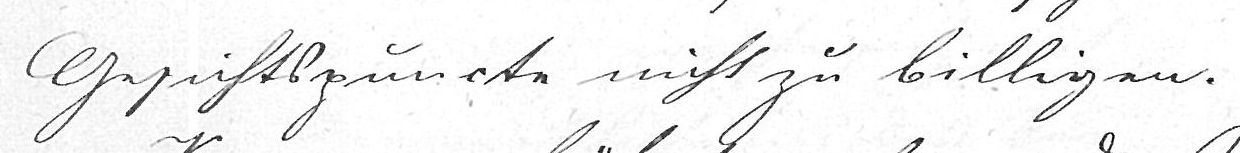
Gesichtspuncte nicht zu billigen.
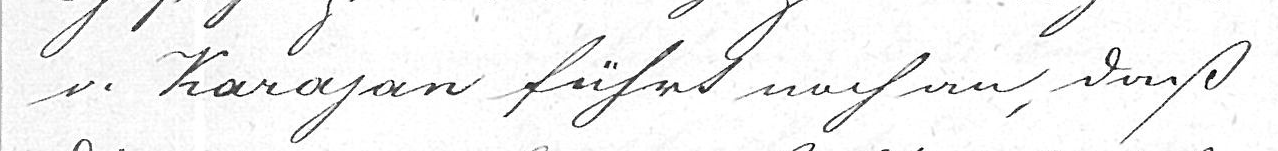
v. Karajan führt noch an, daß
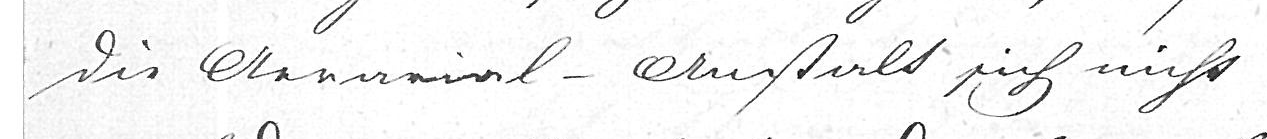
die Aerarial-Anstalt sich nicht
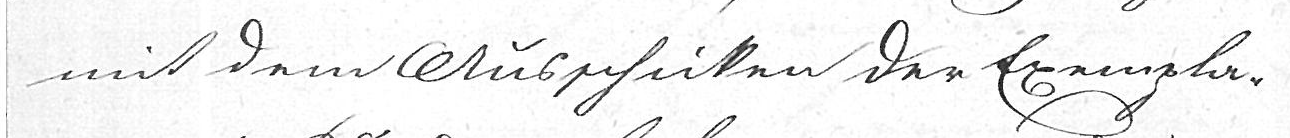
mit dem Ausschicken der Exempla-
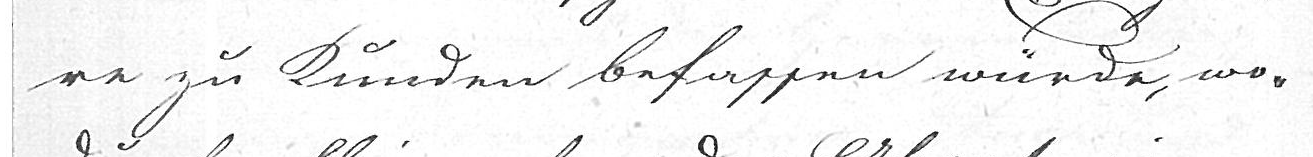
re. zu Kunden befassen würde, wo-
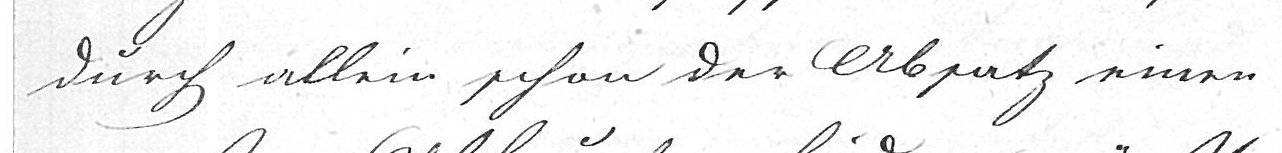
durch allein schon der Absatz einen
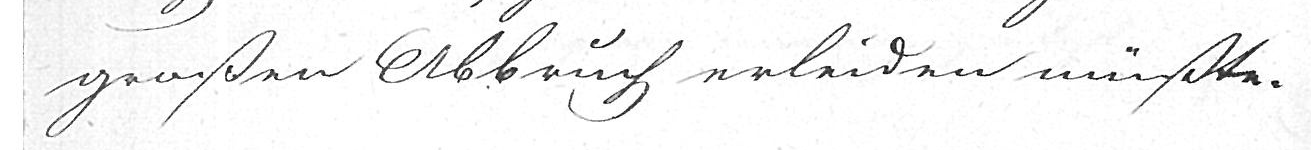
großten Abbruch erleiden müßte.
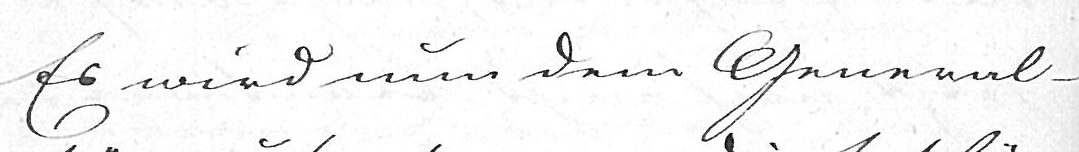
Er wird nun dem General-
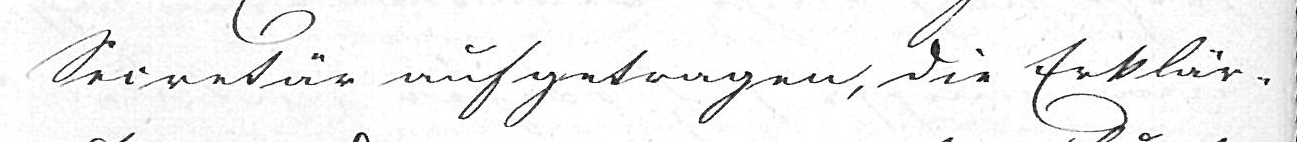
Secretär aufgetragen, die Erklär-
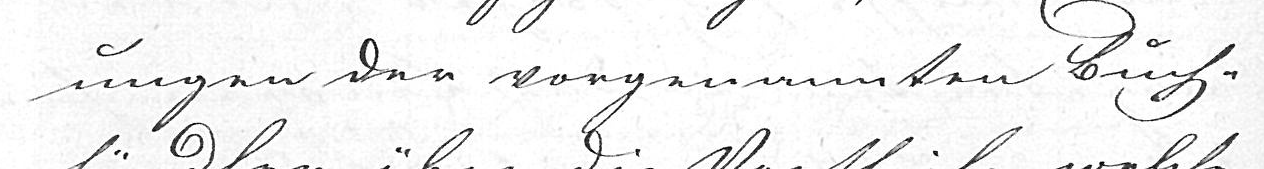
ungen der vorgenannten Buch-
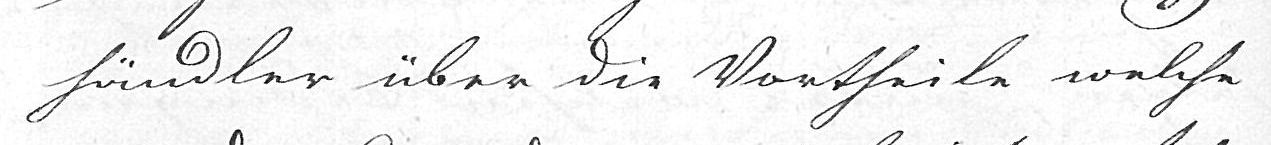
händler über die Vortheile, welche
